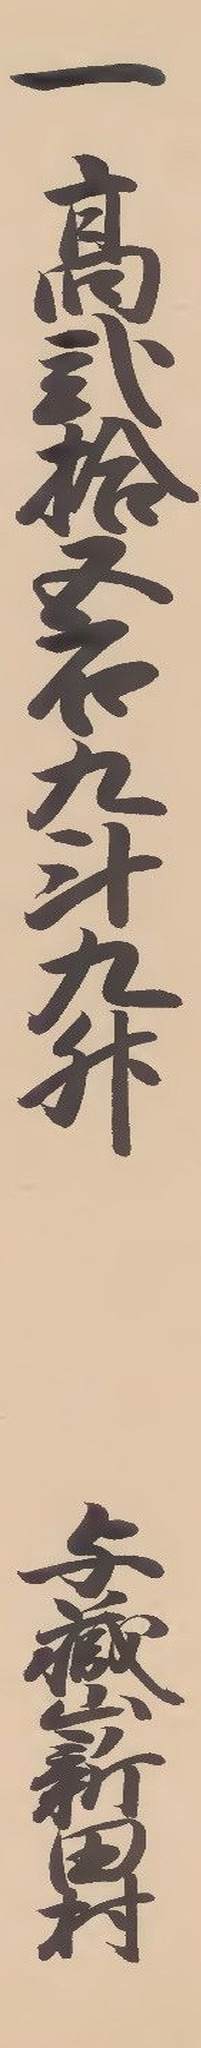一高弐拾五右九斗九升与蔵山新田村
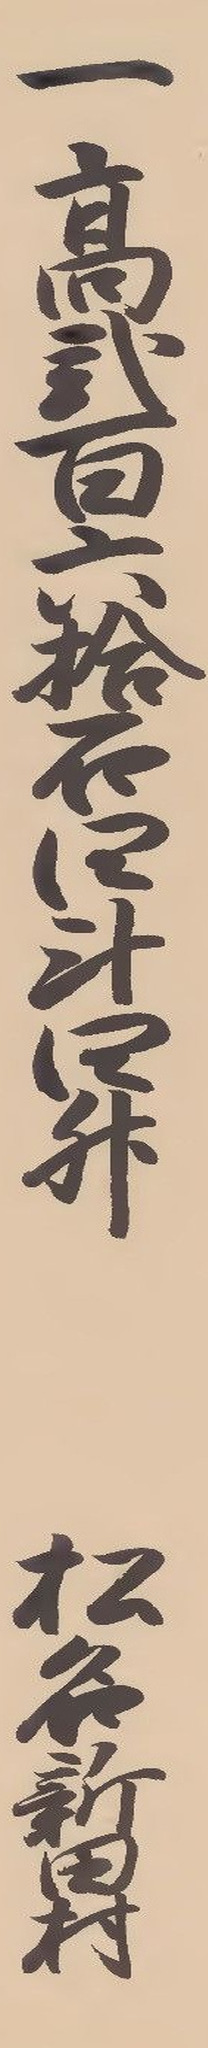一高弐百六拾石四斗四升松名新田村
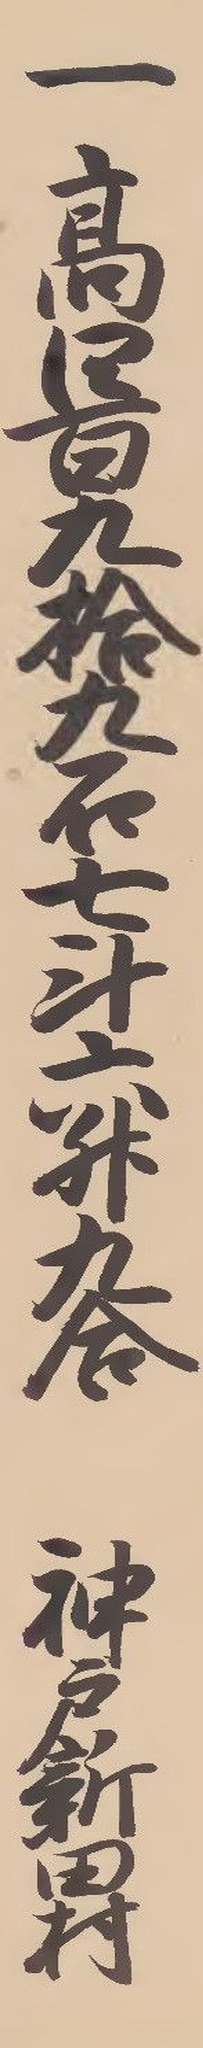一高四百九拾九石七斗六升九合神戸新田村
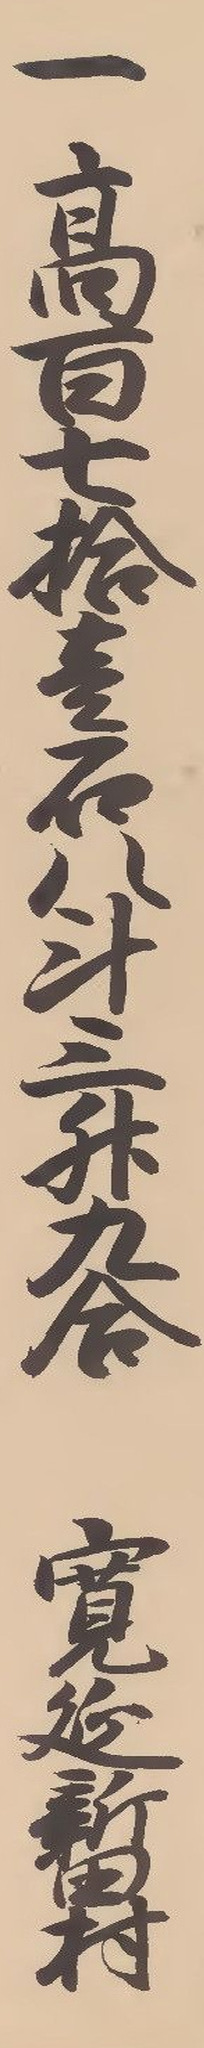一高百七拾壱石八斗三升九合寛延新田村
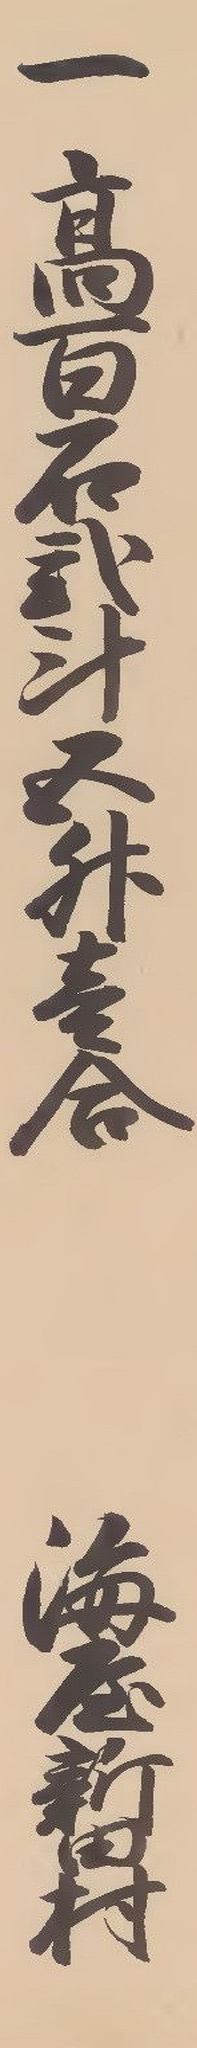一高百石弐斗五升壱合海屋新田村
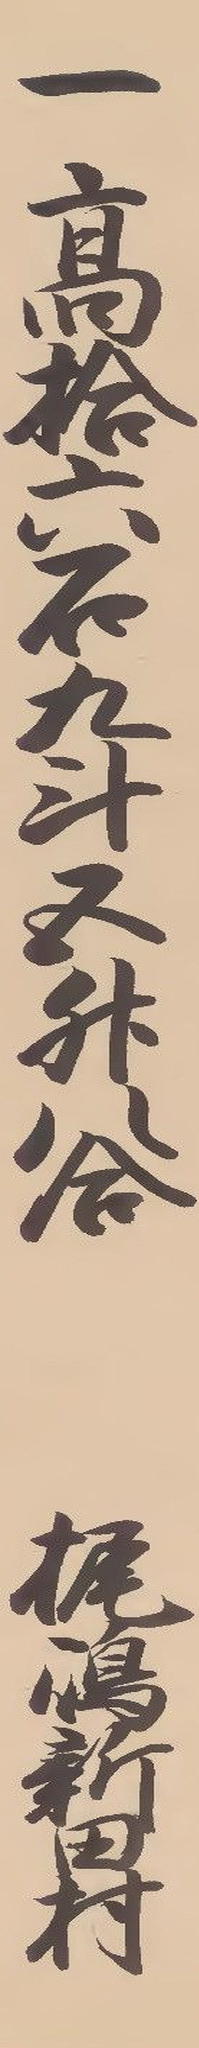一高拾六石九斗五升八合梶島新田村
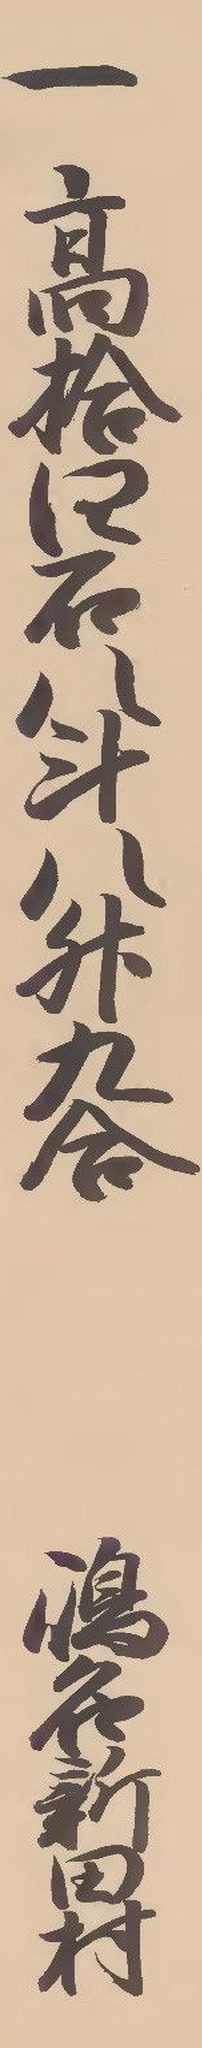一高拾四石八斗八升九合島名新田村

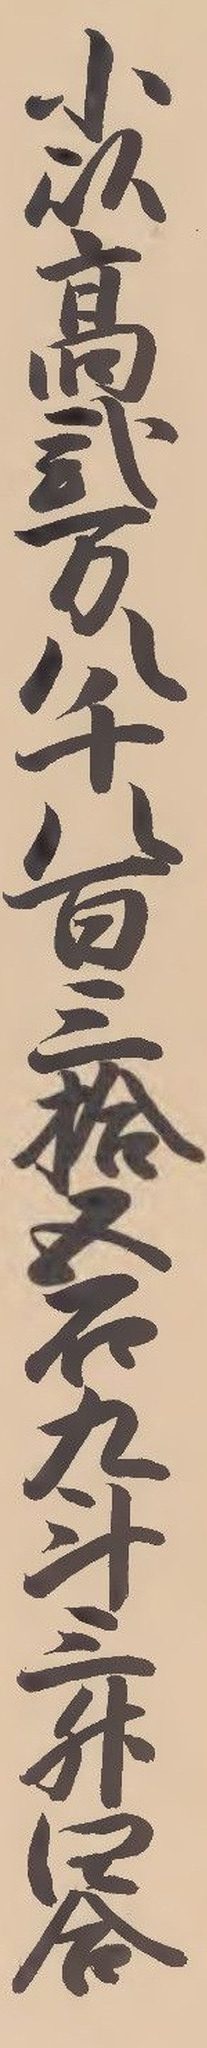小以高弐万八千八百三拾五石九斗三升四合
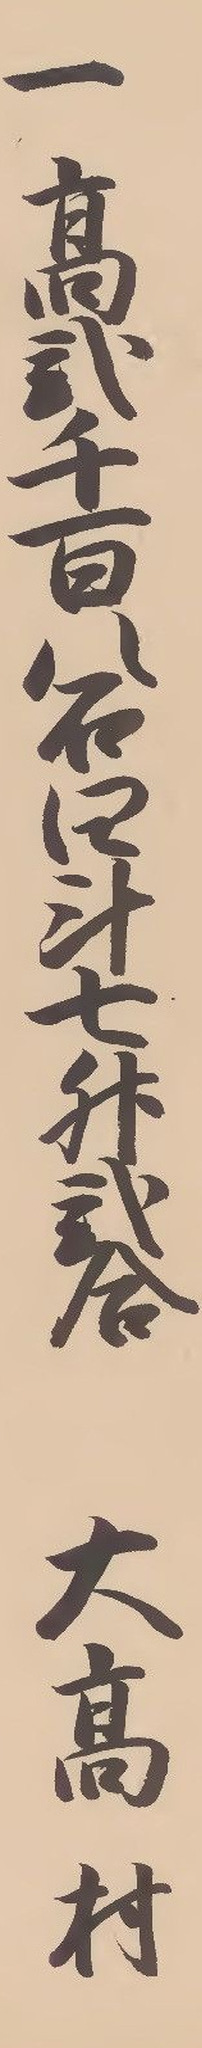一高弐千百八石四斗七升弐合大高村
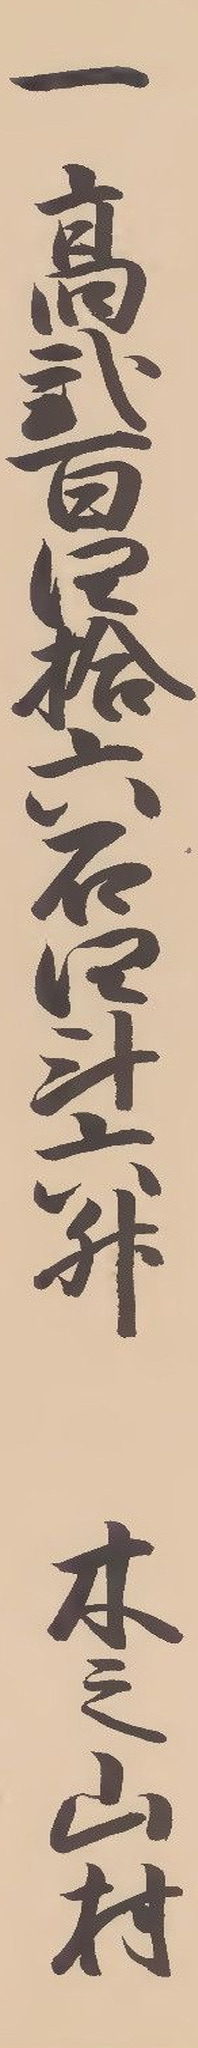一高弐百四拾六石四斗六升木之山村
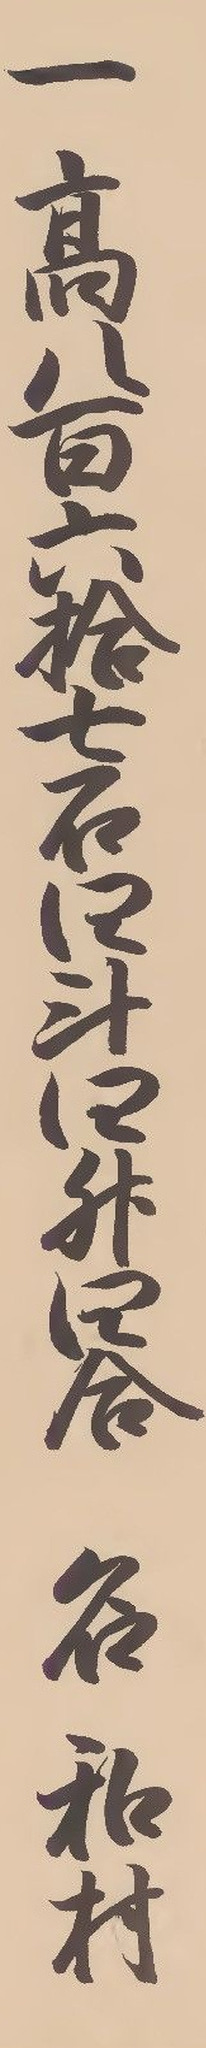一高八百六拾七石四斗四升四合名和村

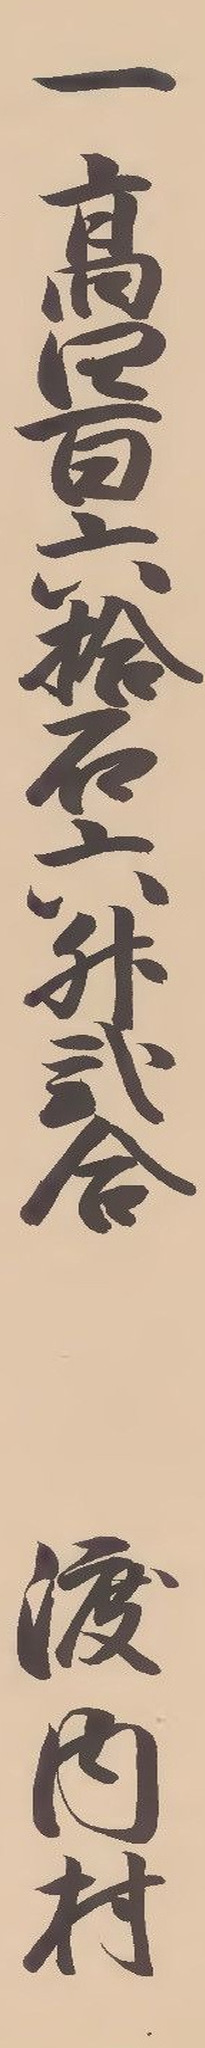一高四百六拾石六升弐合渡内村
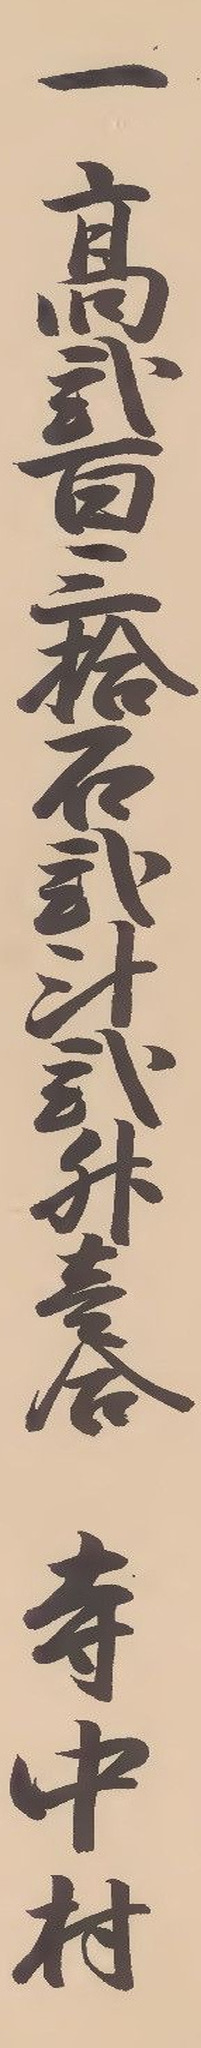一高弐百三拾石弐斗弐升壱合寺中村
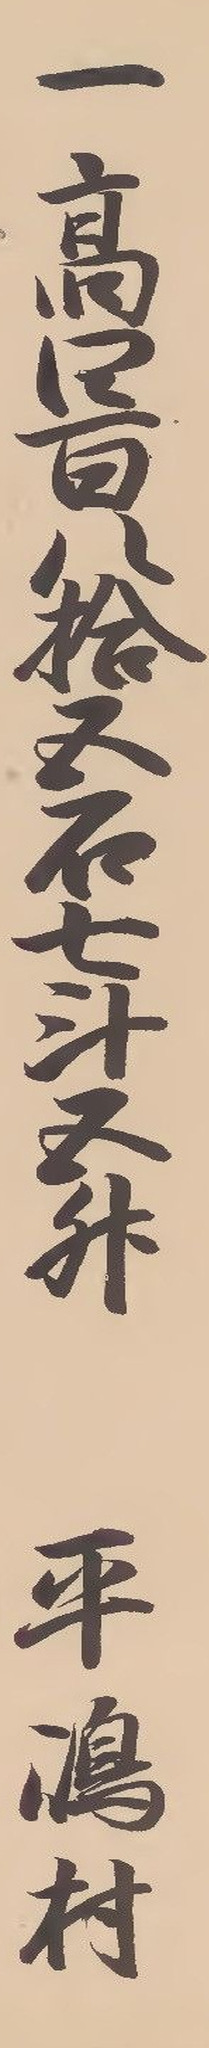一高四百八拾五石七斗五升平島村
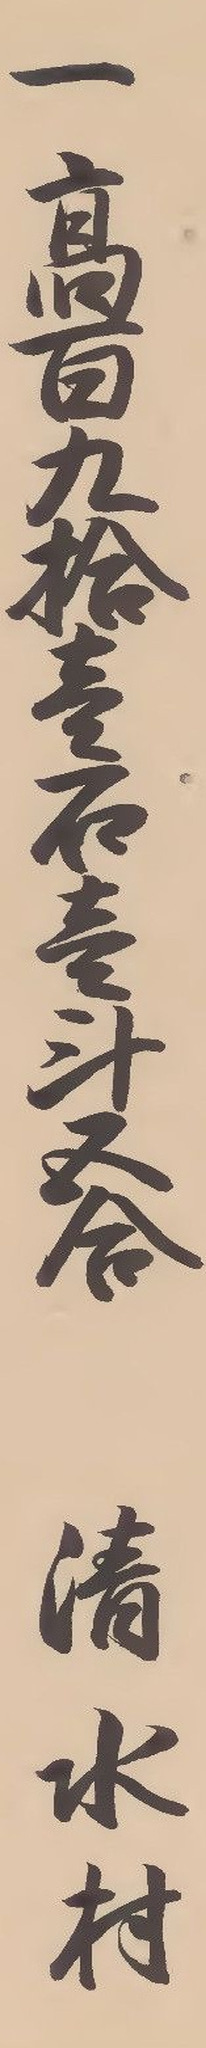一高百九拾壱石壱斗五合清水村
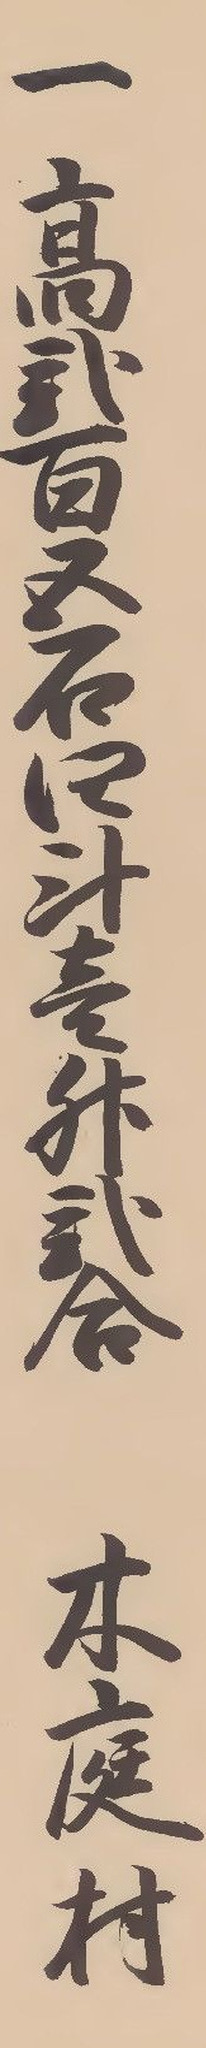一高弐百五石四斗壱升弐合木庭村
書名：尾張国郷帳
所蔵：国立公文書館 National Archives of Japan
